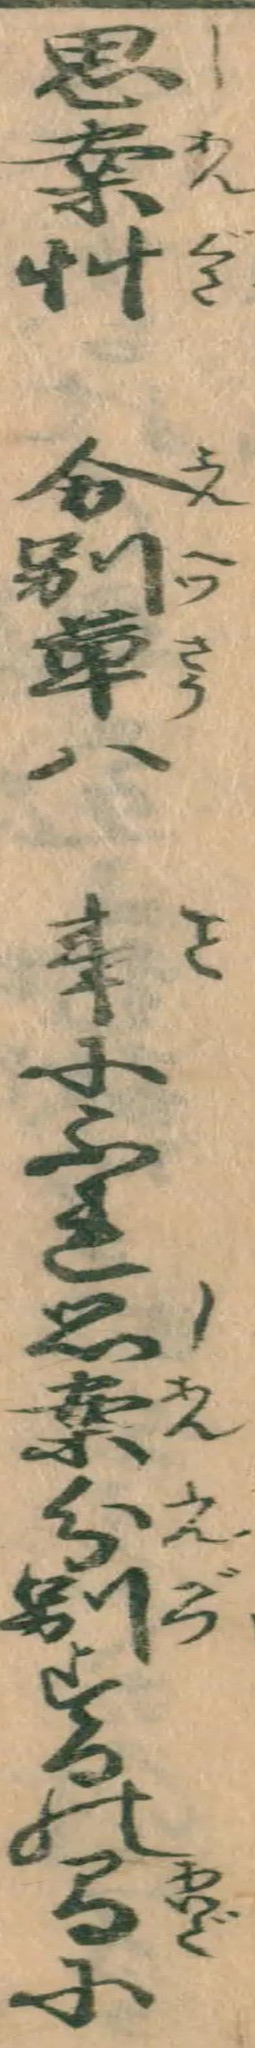思案草分別草は事にふれ思案分別するの間に
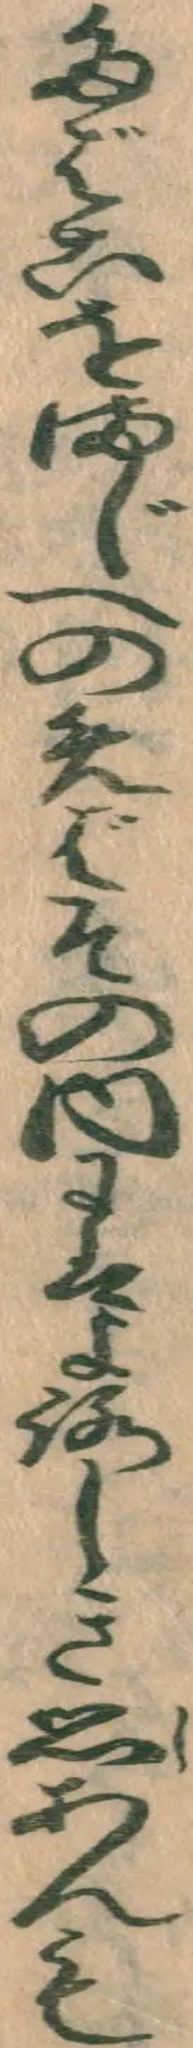たばこをまじへのめばその内にはよろしき思あんも
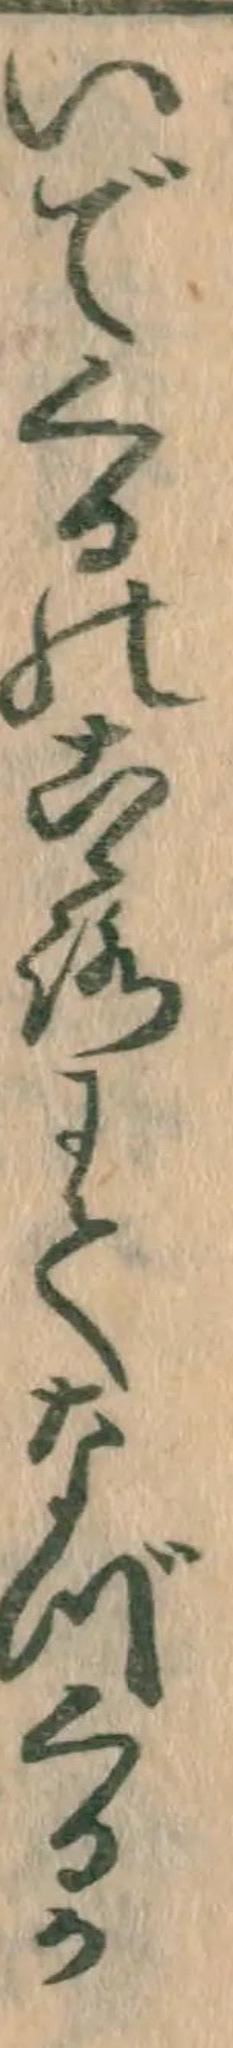いでくるのこゝろにてなづくるか
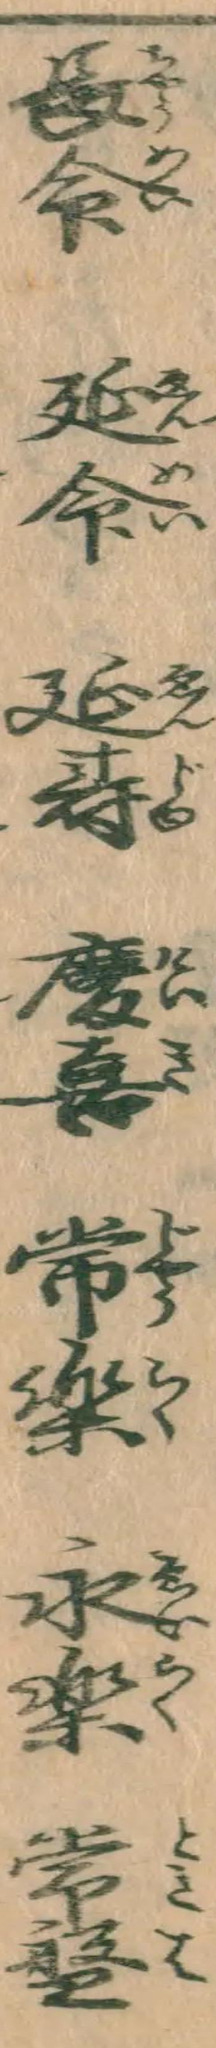長命延命延寿慶喜常楽永楽常盤
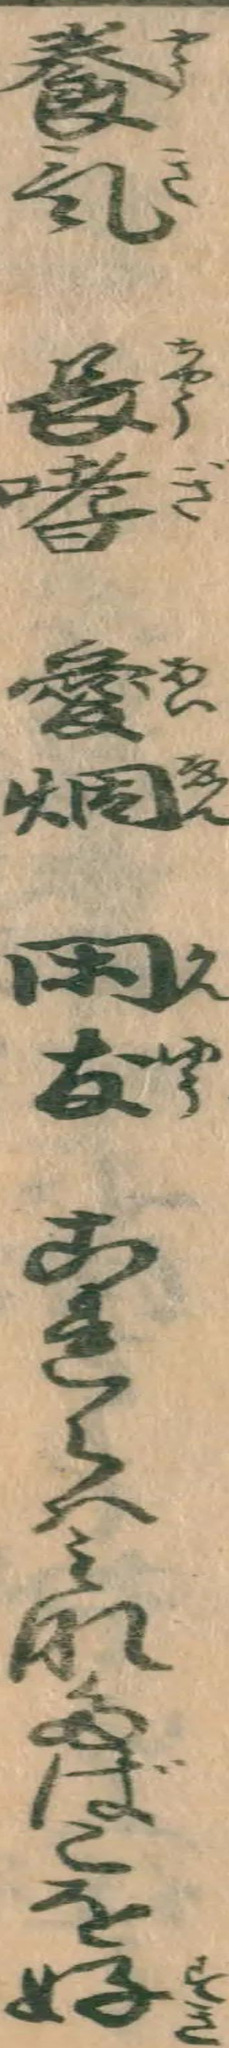養気長嗜愛烟閑友これらはみなたばこを好
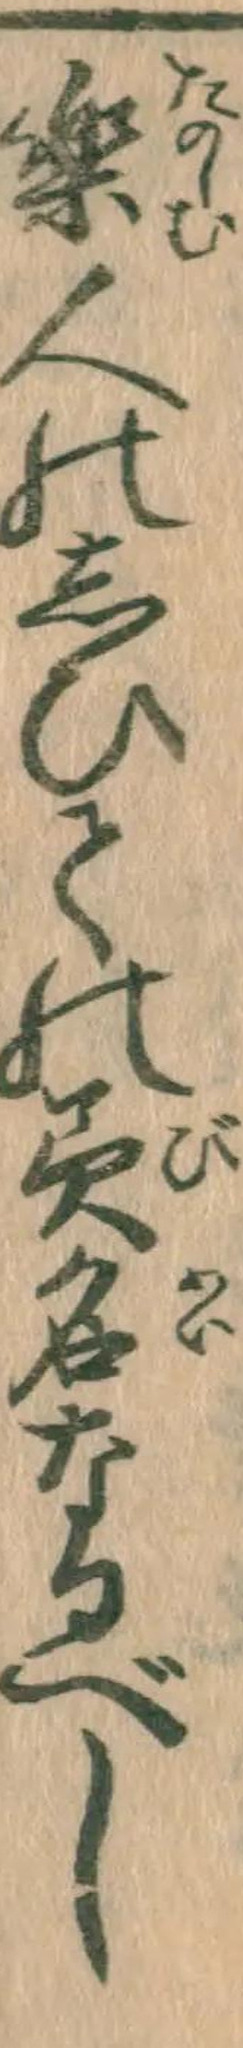楽人のしひての美名なるべし
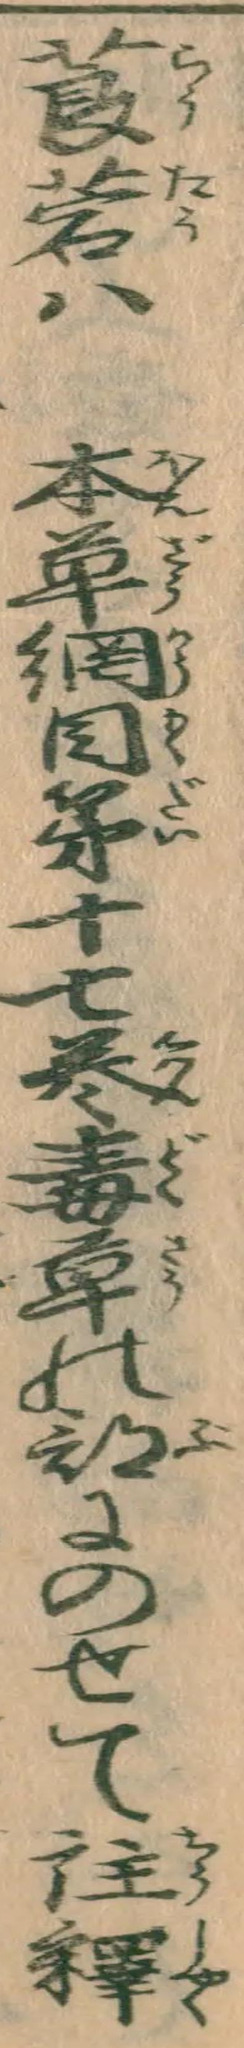莨菪は本草綱目第十七巻毒草の部にのせて註釈
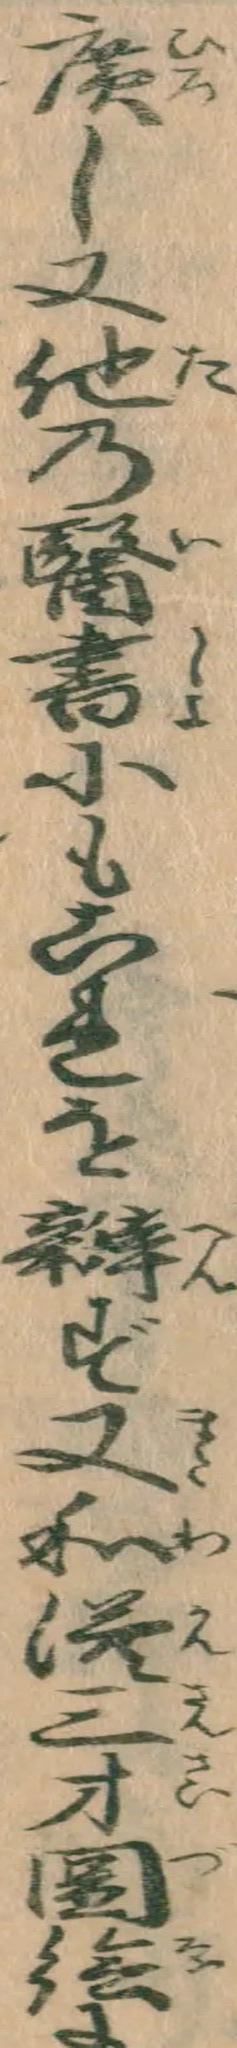広し又他の医書にもこれを弁ず又和漢三才図絵に
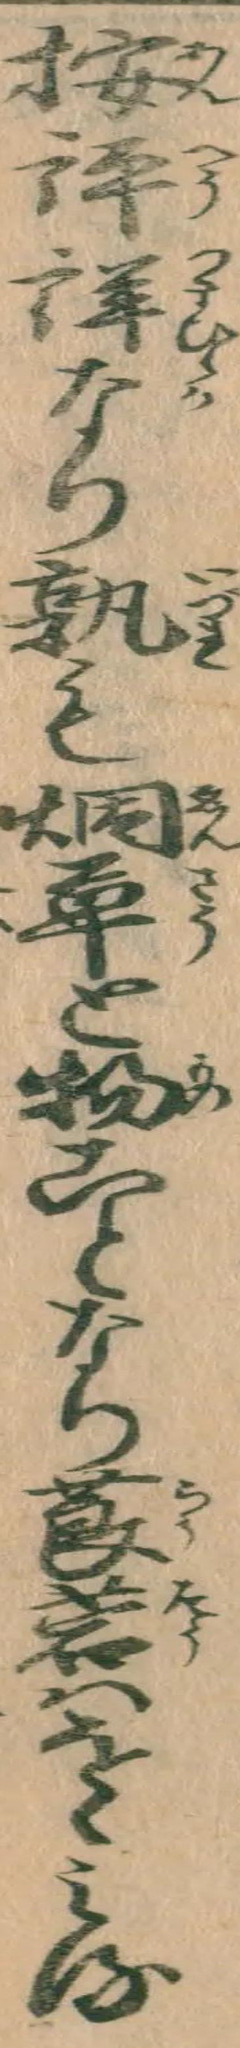按評詳なり孰も烟草と物ことなり莨菪はをゝみる
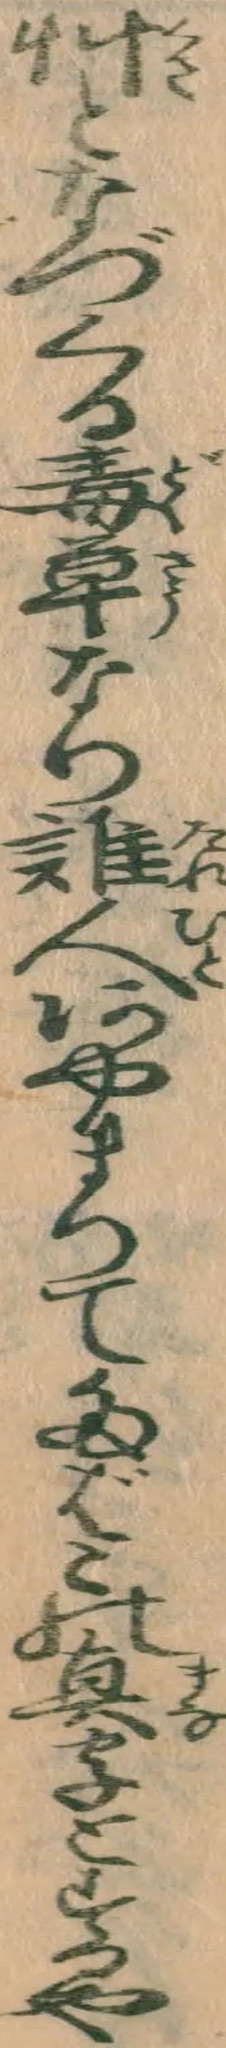草となづくる毒草なり誰人あやまりてたばこの真字とするや
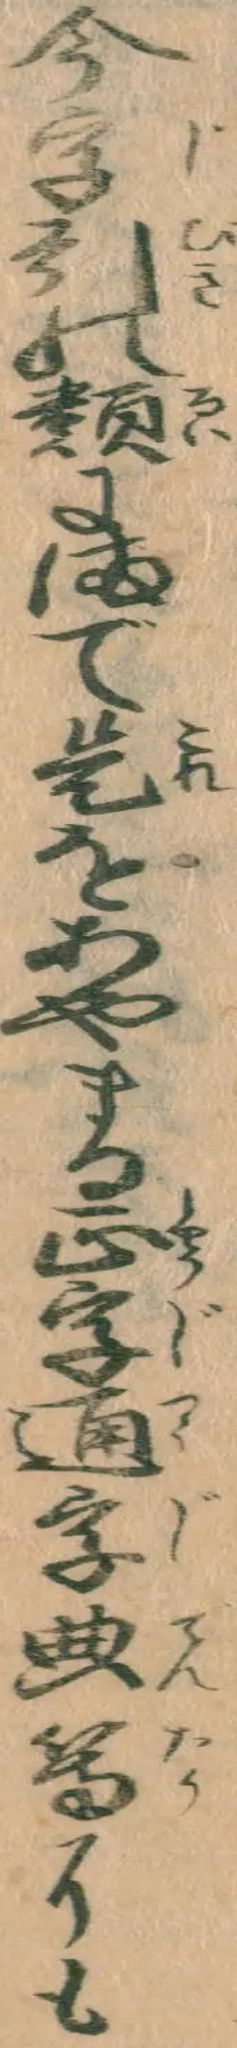今字引の類にまで是をあやまる正字通字典等にも
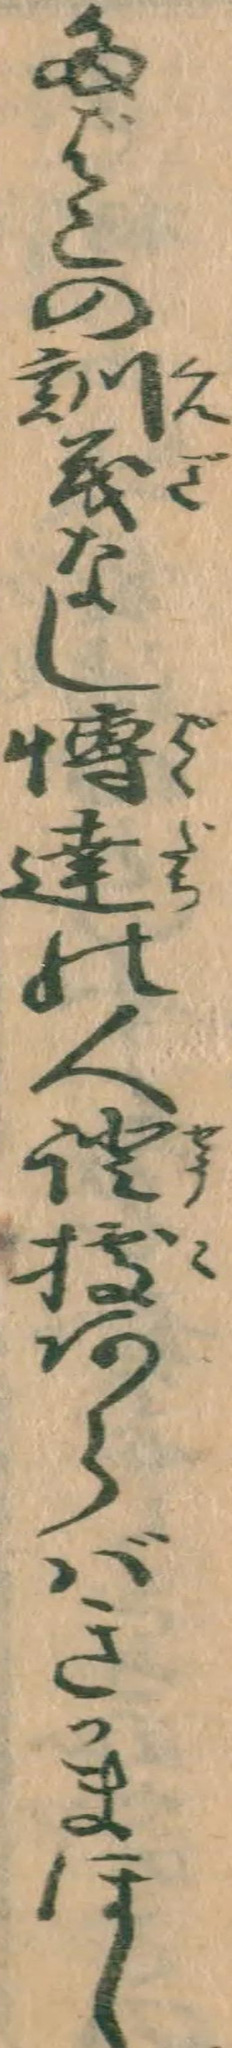たばこの訓義なし博達の人証拠あらばきかまほし
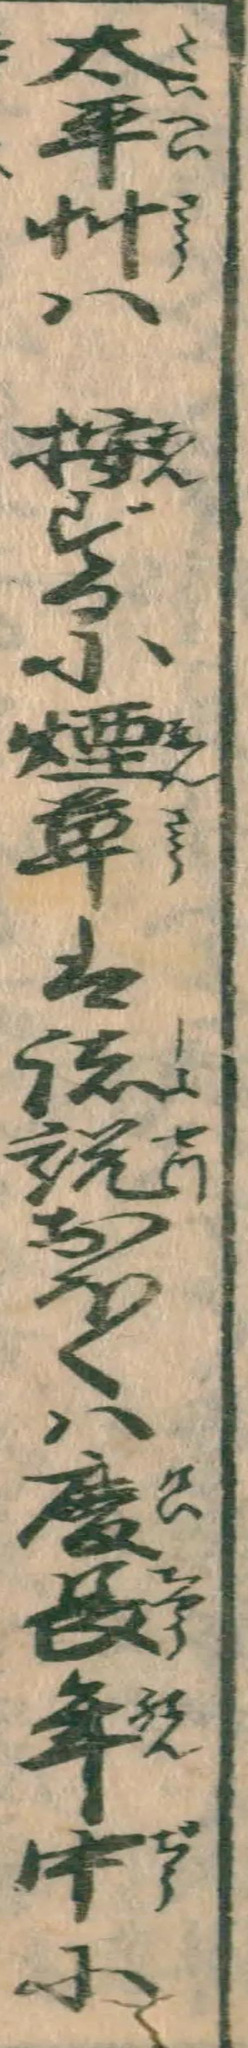太平草は按ずるに煙草は諸説おほくは慶長年中に
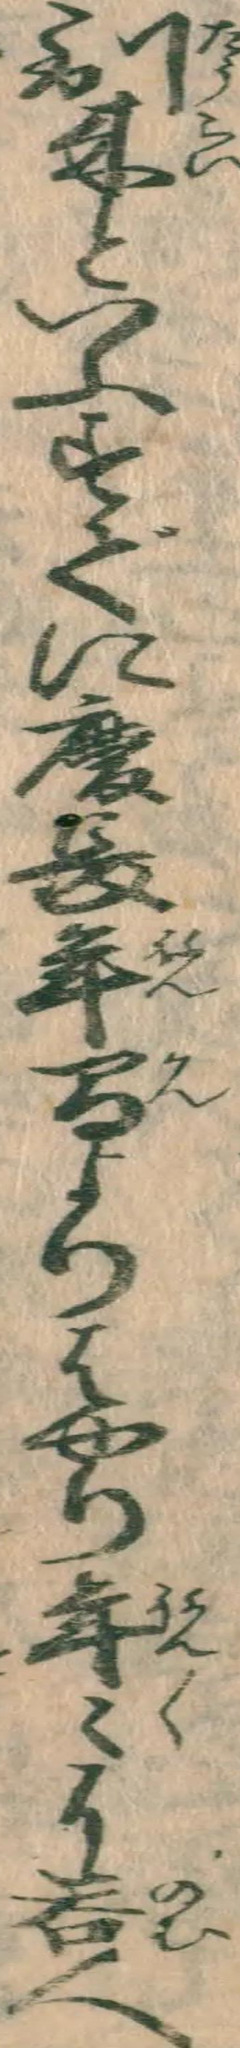到来といふすでに慶長年間よりはやり年々に呑人
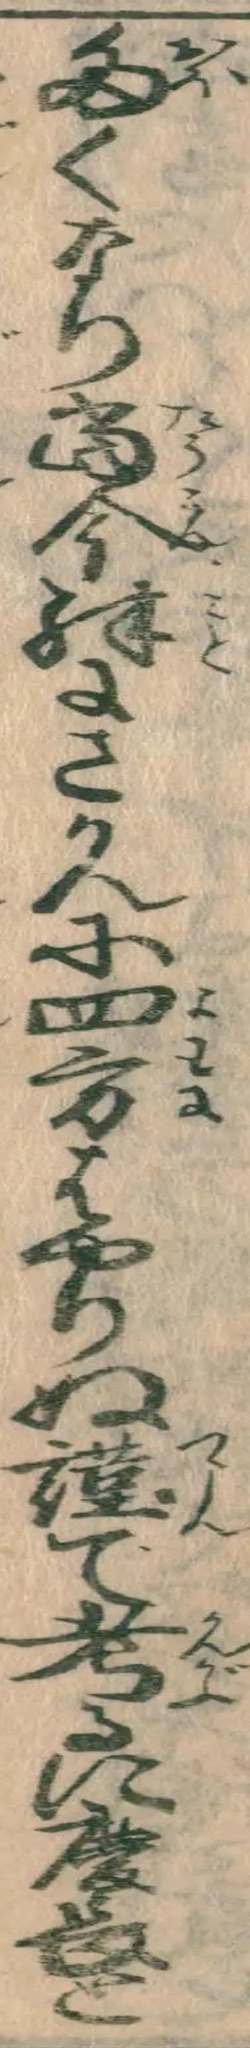多くなり当今殊にさかんに四方はやりぬ謹て考るに慶長と
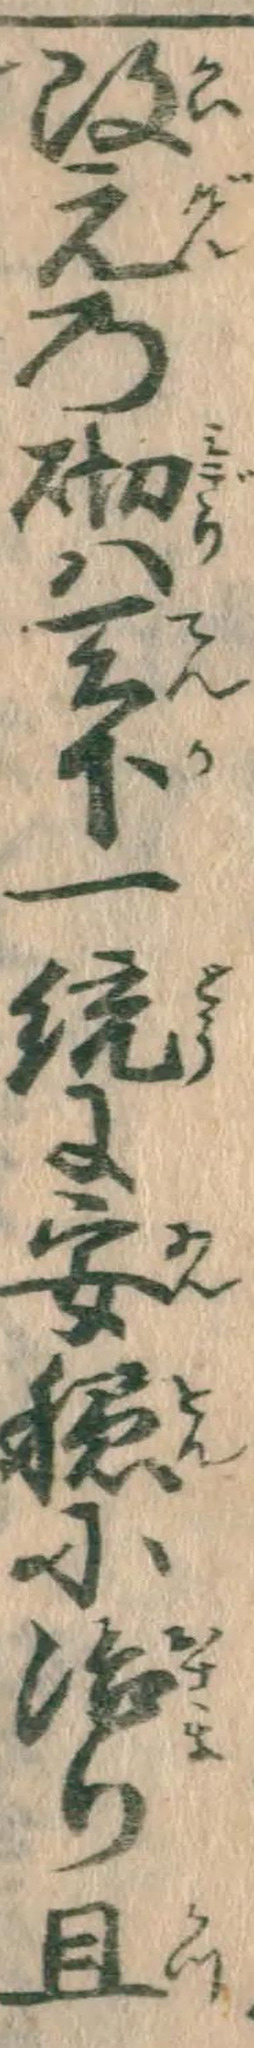改元の砌は天下一統に安穏に治り且
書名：煙草記
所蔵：国立国会図書館 National Diet Library, JAPAN
